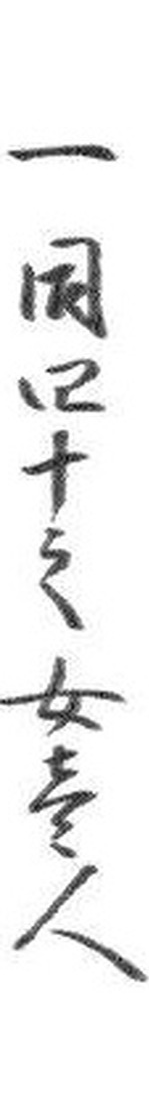一同四十之女壱人
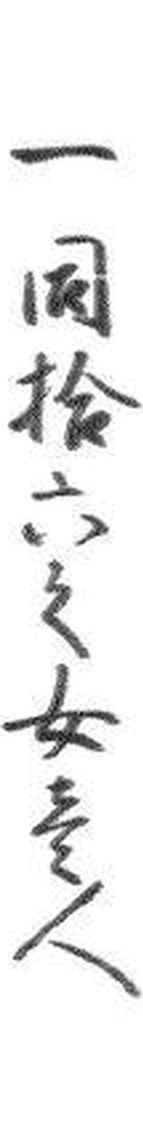一同拾六之女壱人
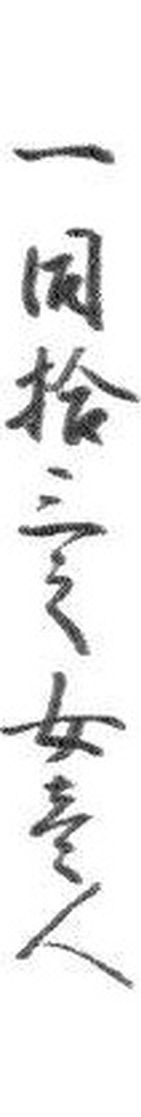一同拾三之女壱人
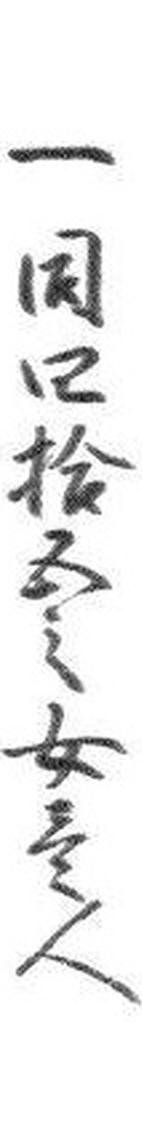一同四拾五之女壱人
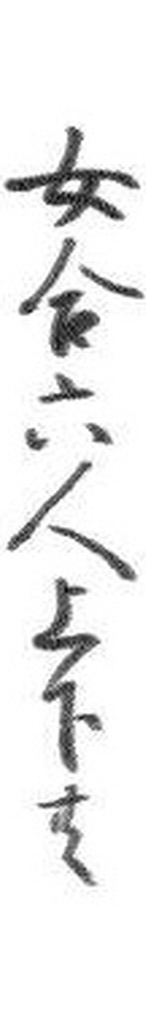女合六人上下共

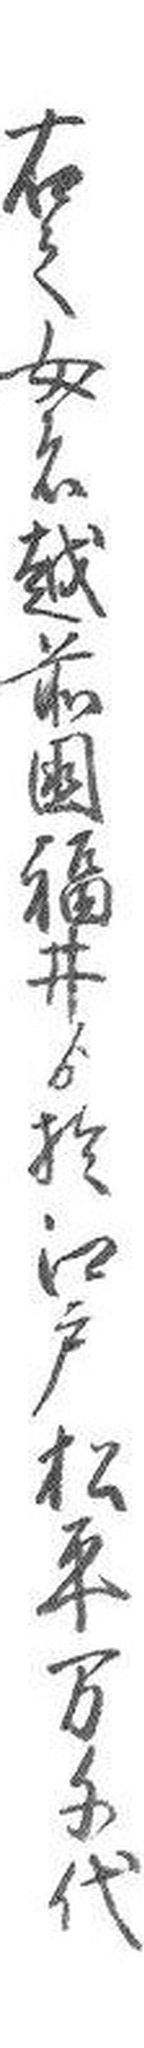右之女者越前国福井ゟ於江戸松平万千代
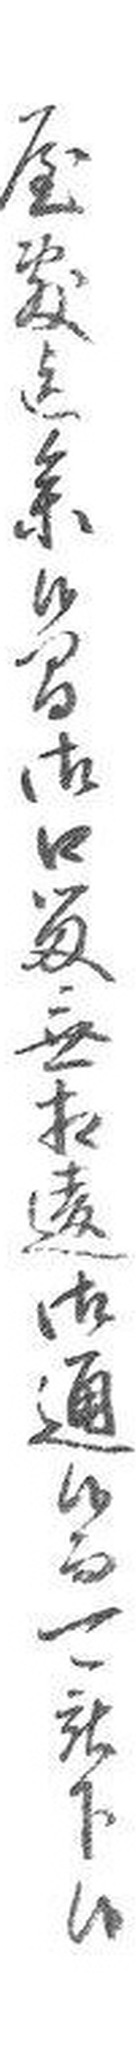屋敷迄参候間御口留無相違御通候而可被下候
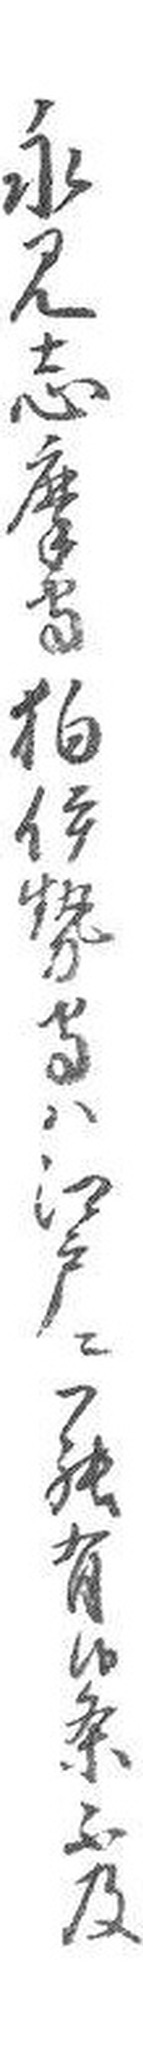永見志摩守狛伊勢守ㇵ江戸ニ罷有候条不及
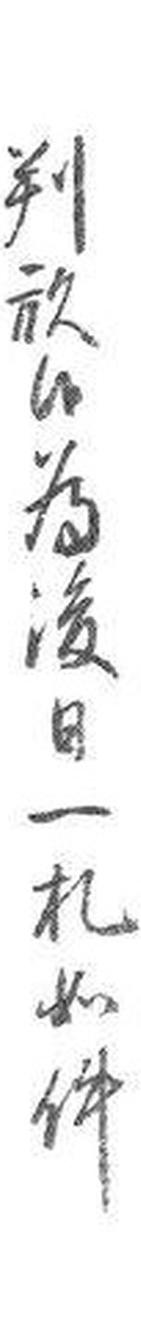判形候為後日一札如件
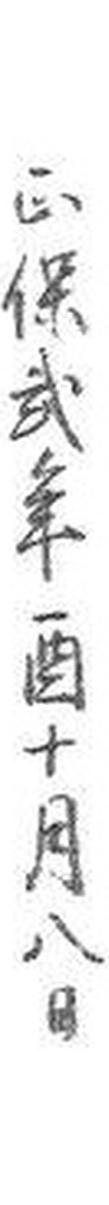正保弐年酉十月八日
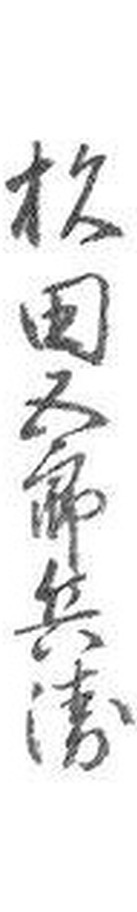杉田五郎兵衛
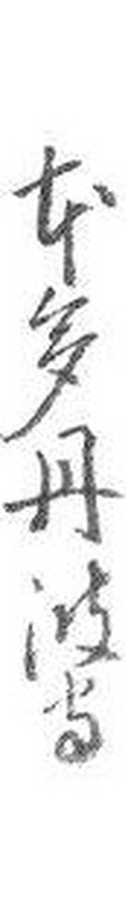本多丹波守
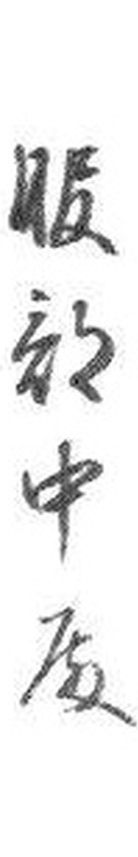服部中殿
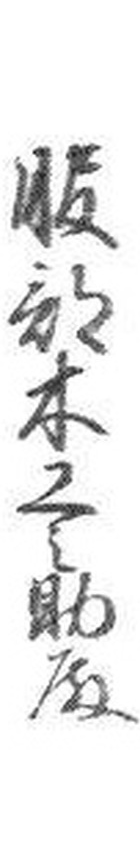服部木工之助殿
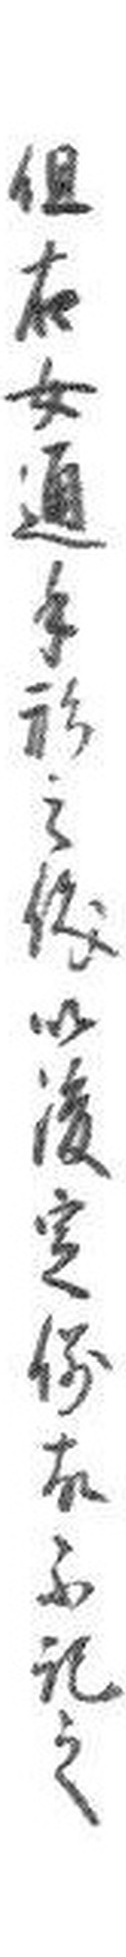但右女通手形之儀以後定例故不記之
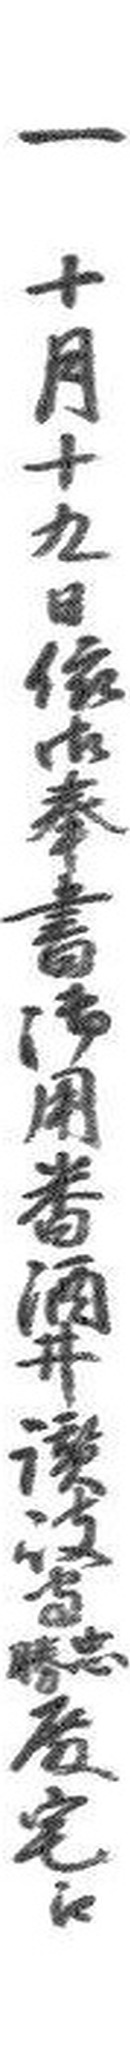一十月十九日依御奉書御用番酒井讃岐守忠勝殿宅江
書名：家譜 五 光通公 従寛永十三年到万治二年
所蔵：福井県文書館 Fukui Prefectural Archives
